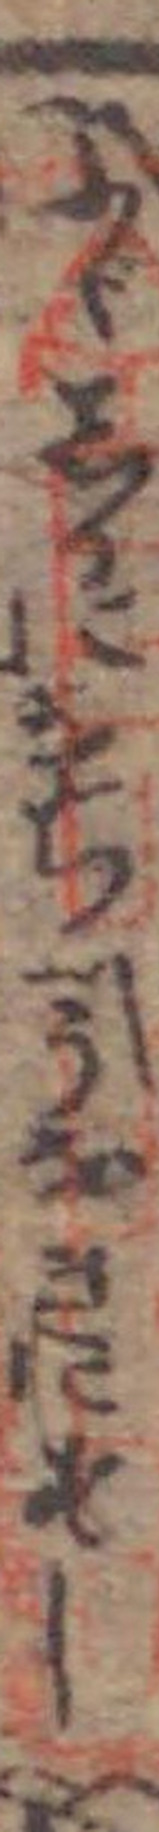〽ふぐしるにもち〽うなぎにすし
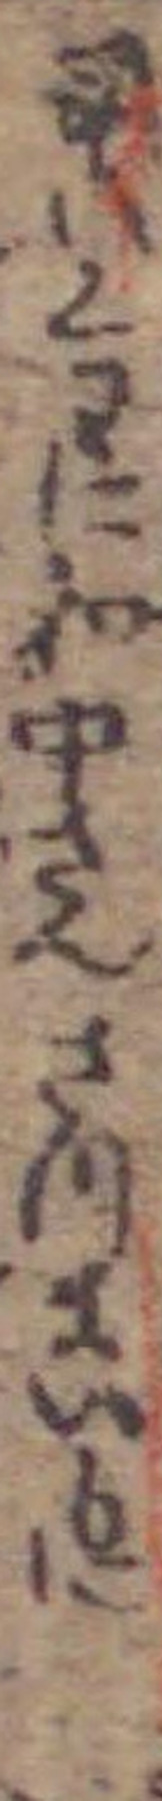〽すいくわに和中さんさつまいもに
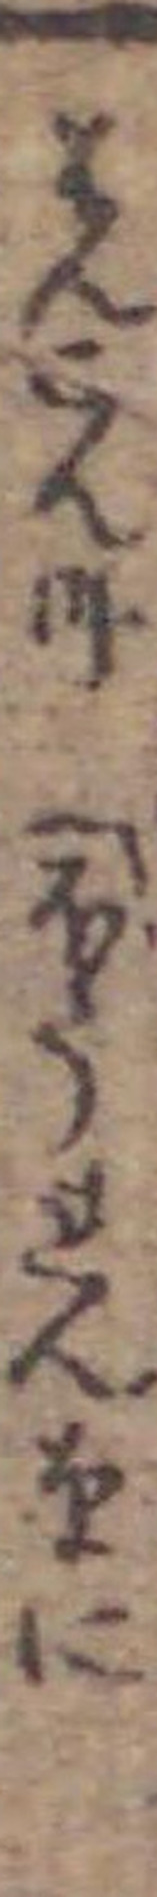はんこん丹〽ほうれん草に
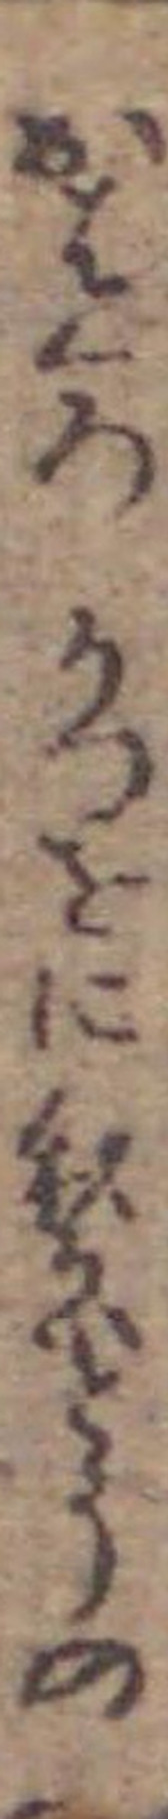おはくろかつをに秋かいとうの
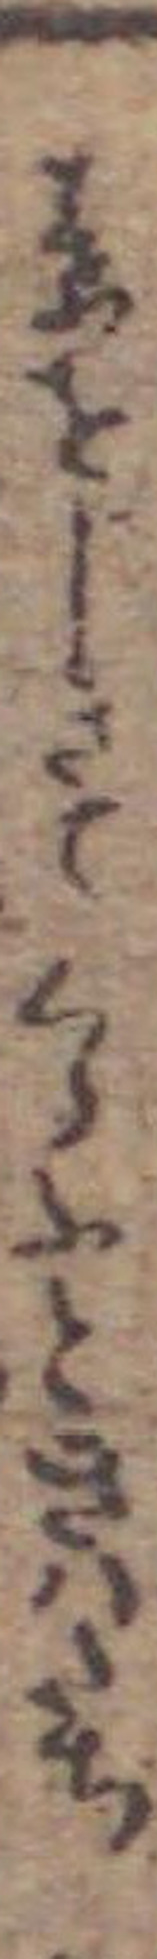葉をしきてくらふときはたち
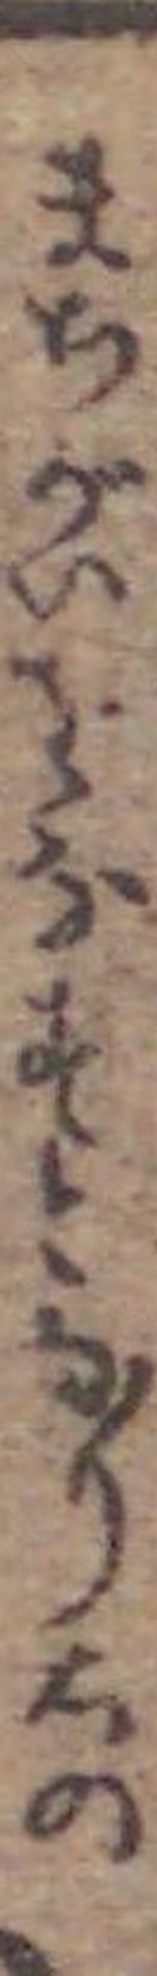まちがいをなすとなり右の
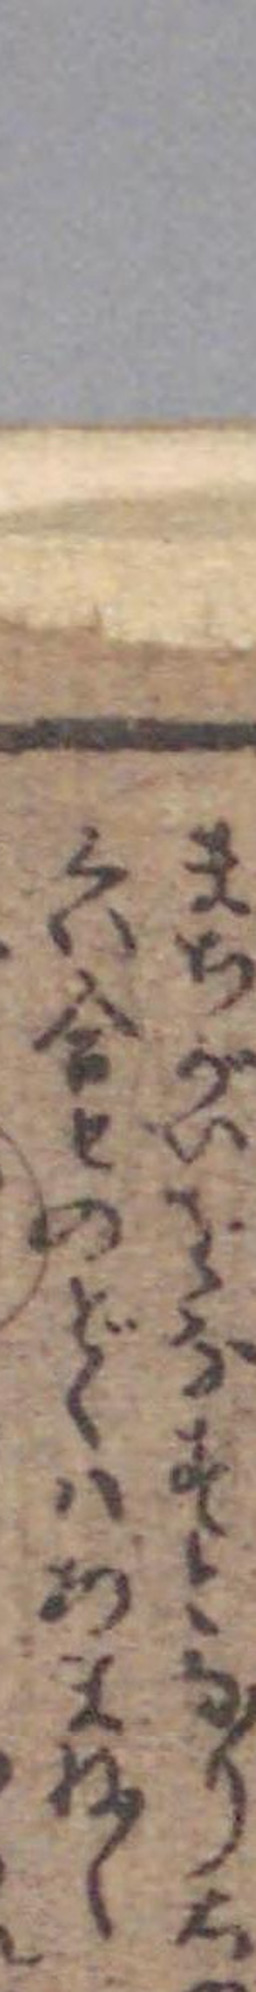くい合せのどくはあまねく
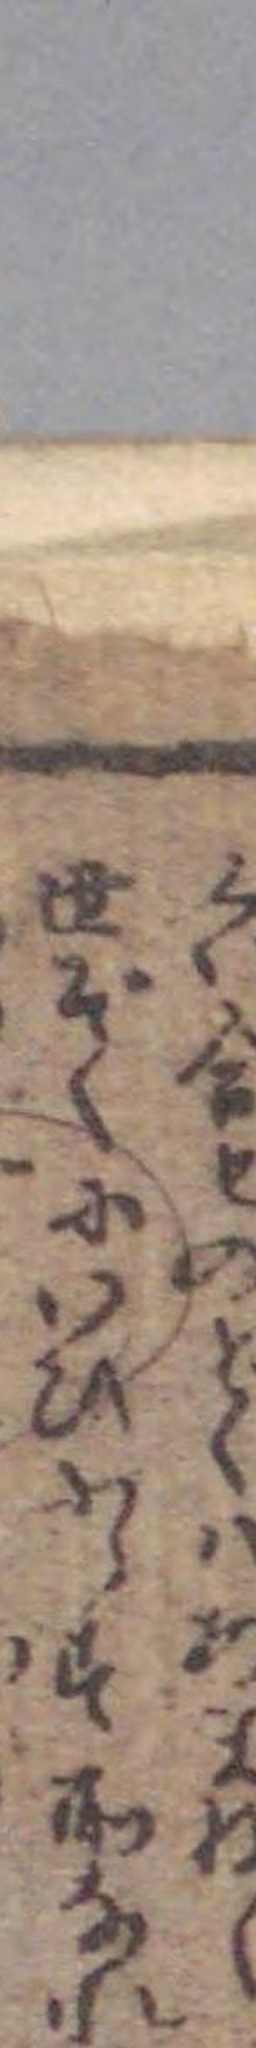世ぞくにいひふるす所なれば
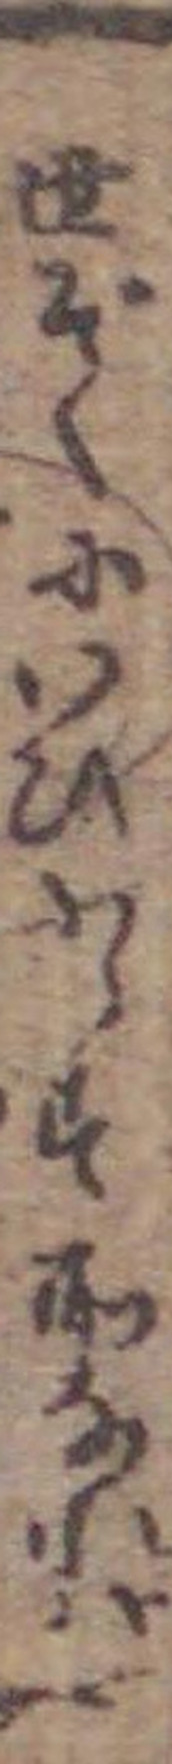世ぞくにいひふるす所なれば
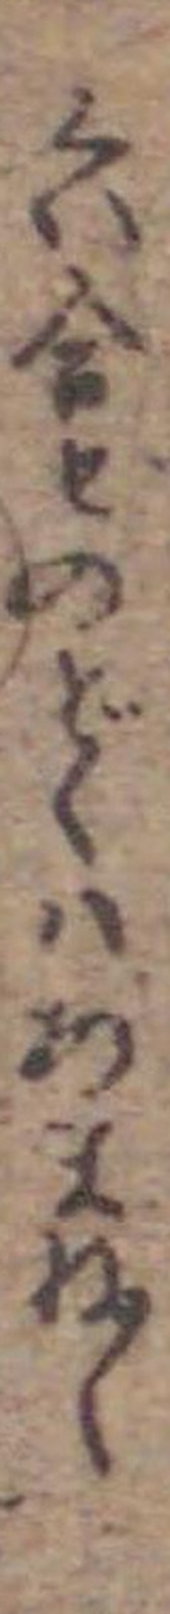くい合せのどくはあまねく

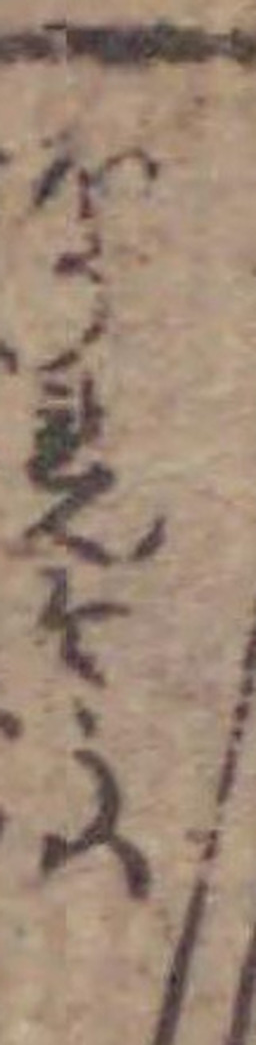ほうれんそうは
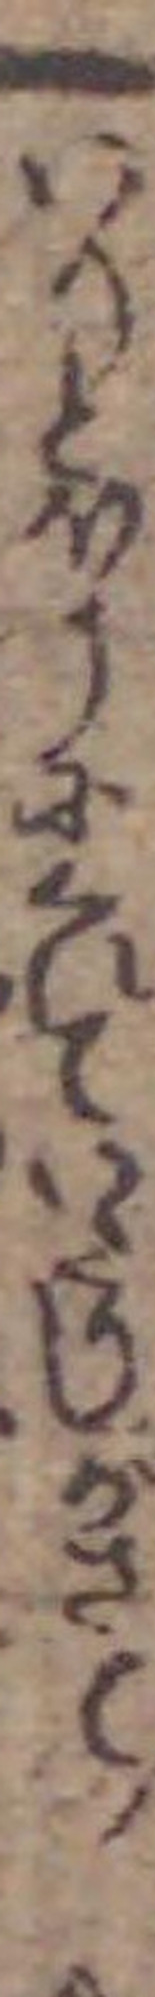いりとほうにくれていたりしがさて
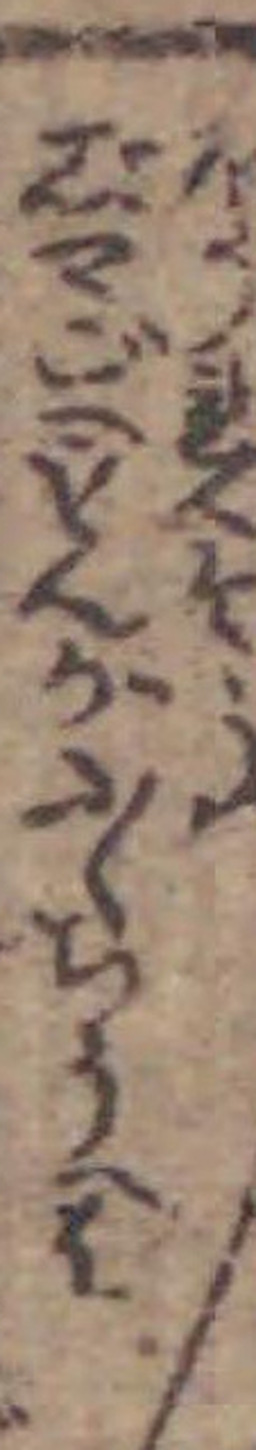じやごへもんがふくちうへは
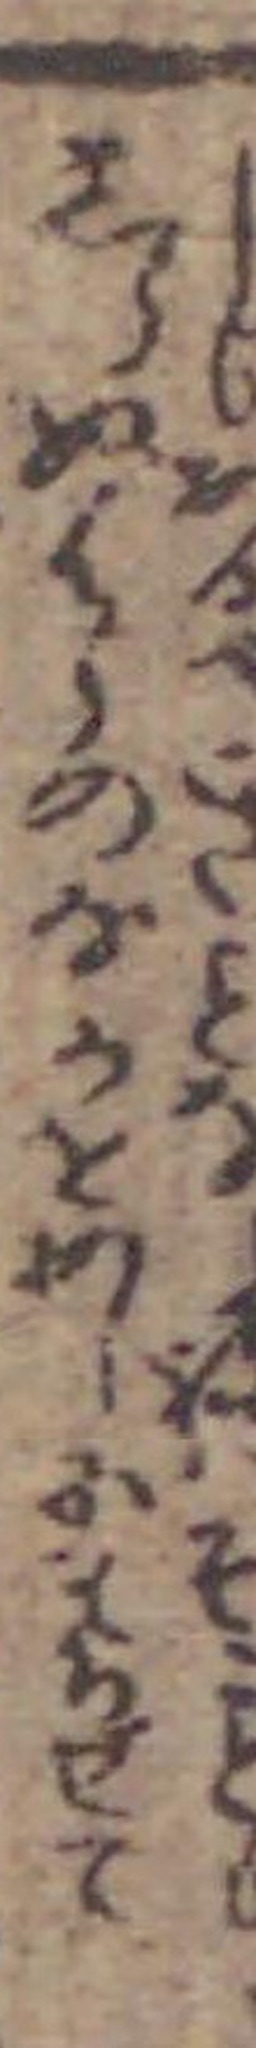しらぬはらのなかをあしにまかせて
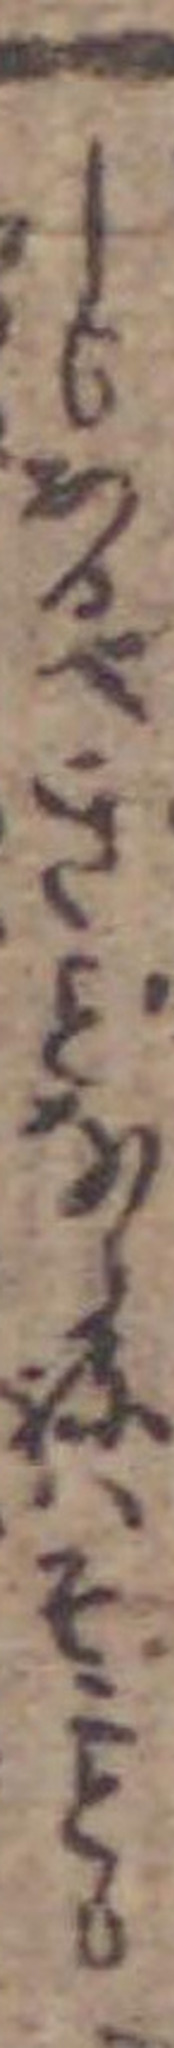しもあるべきことならねはそことも
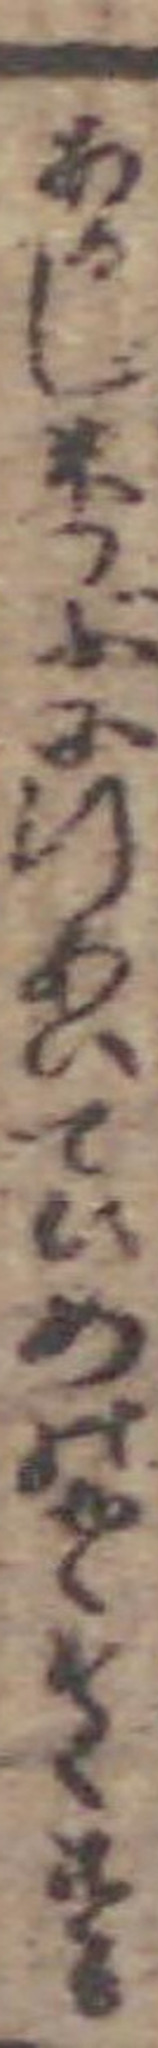あるじ米つぶに行あいてひめのやくそく有る
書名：腹京師食物合戦 : 2巻
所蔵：国立国会図書館 National Diet Library, JAPAN
